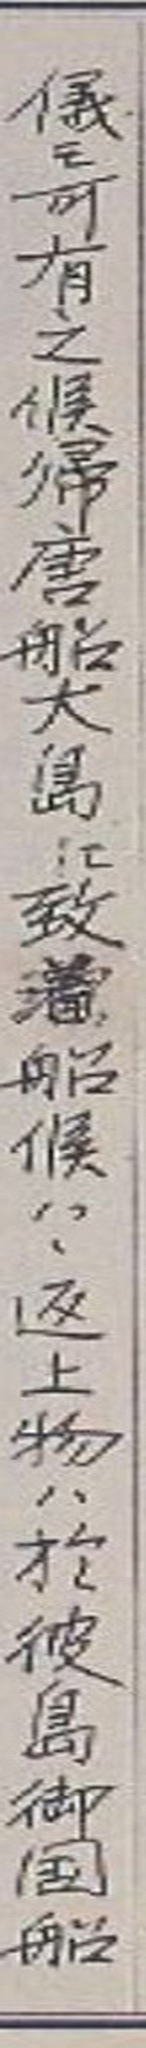儀も可有之候帰唐船大島え致着船候はゝ返上物は於彼島御国船
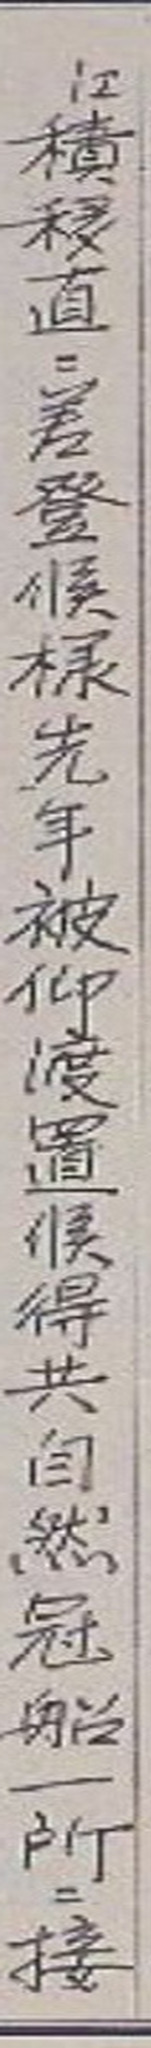え積移直に差登候様先年被仰渡置候得共自然冠船一所に接
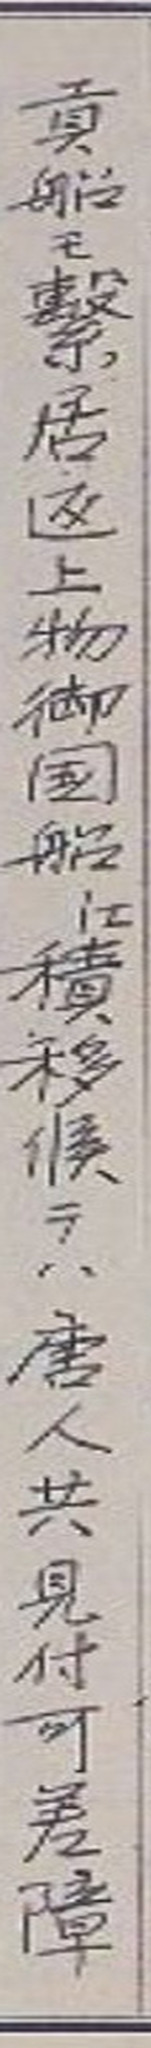貢船も繋居返上物御国船え積移候ては唐人共見付可差障
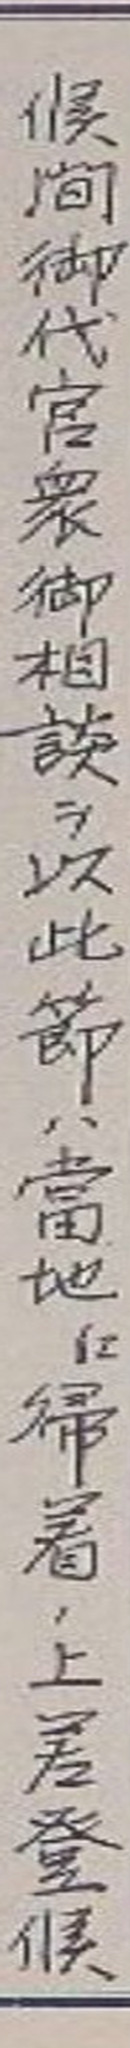候間御代官衆御相談を以此節は当地え帰着の上差登候

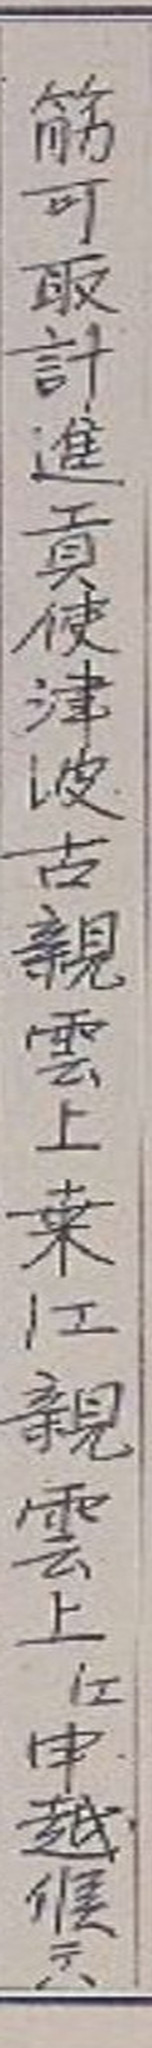筋可取計進貢使津波古親雲上桑江親雲上え申越候ては
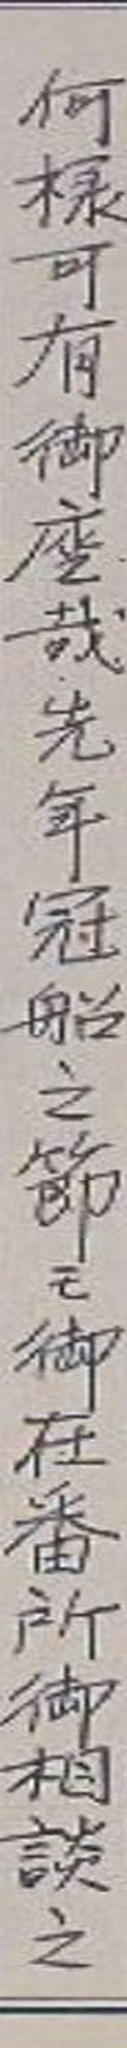何様可有御座哉先年冠船之節も御在番所御相談之
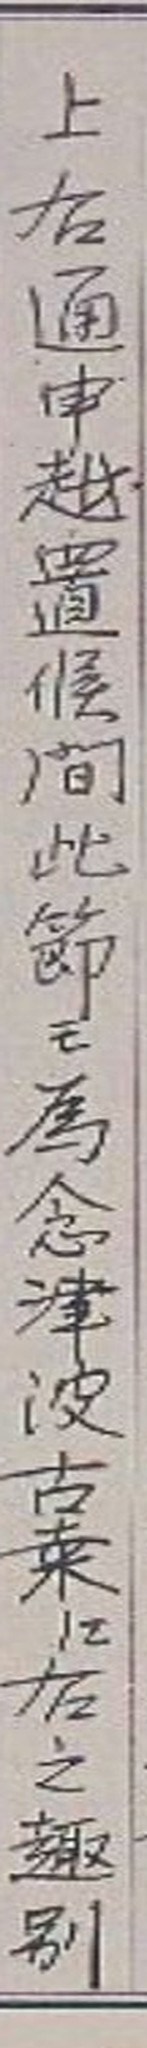上右通申越置候間此節も為念津波古桑え右之趣別
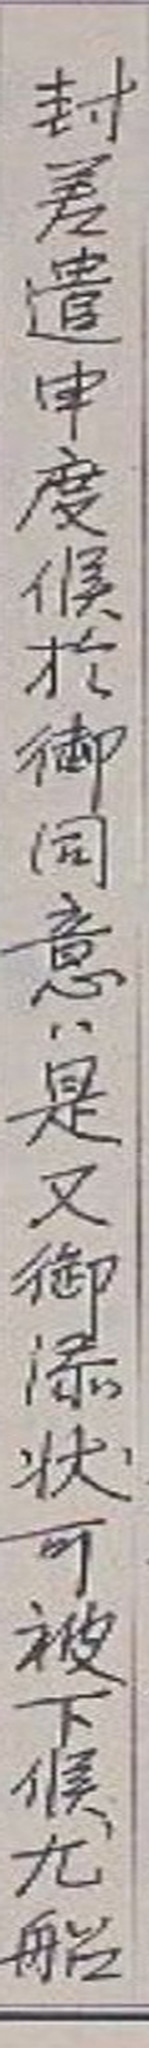封差遣申度候於御同意は是又御添状可被下候尤船
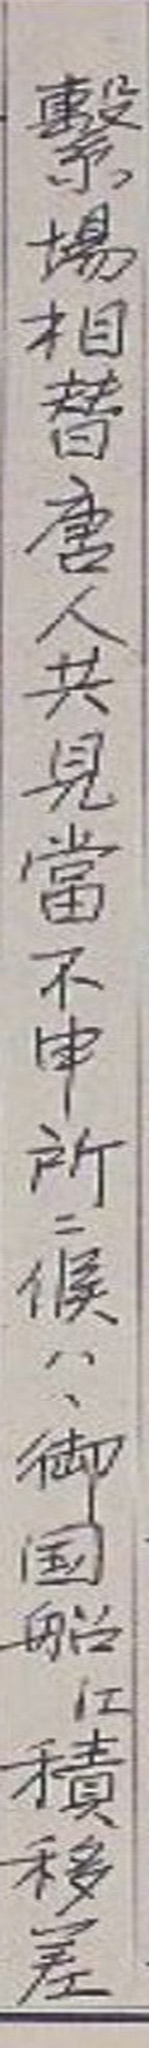繋場相替唐人共見当不申所に候はゝ御国船え積移差
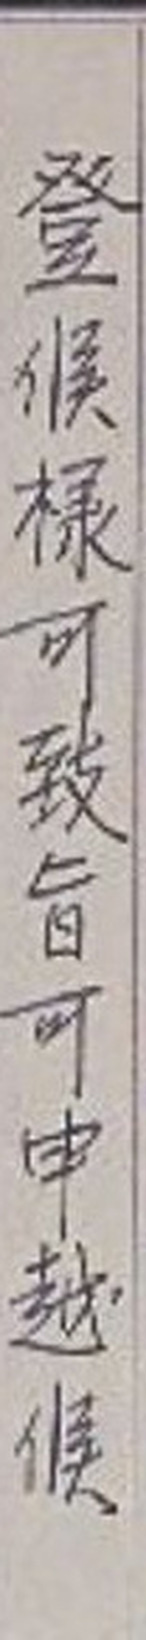登候様可致旨可申越候
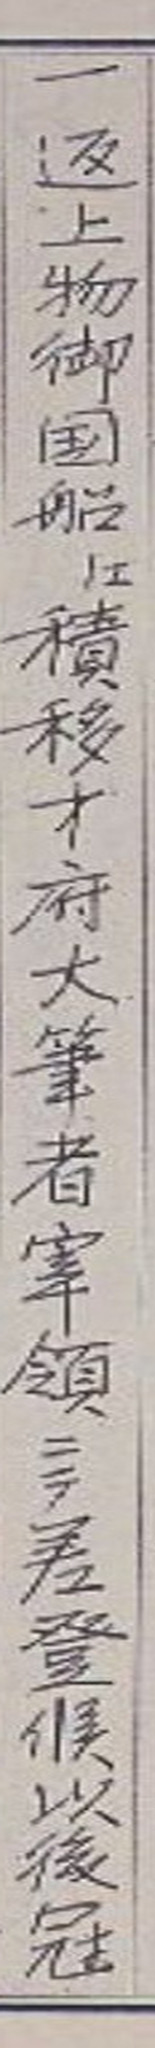一返上物御国船え積移才府大筆者宰領にて差登候以後冠
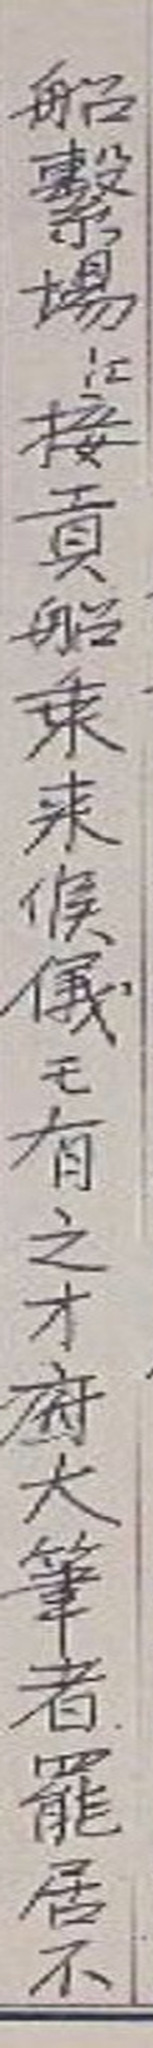船繋場え接貢船乗来候儀も有之才府大筆者罷居不
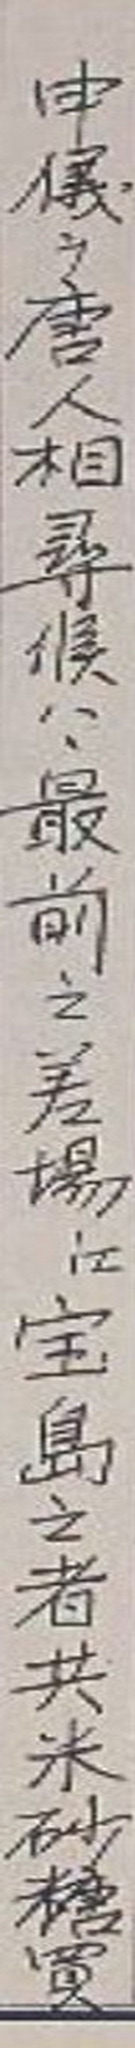申儀を唐人相尋候はゝ最前之差場え宝島之者共米砂糖買
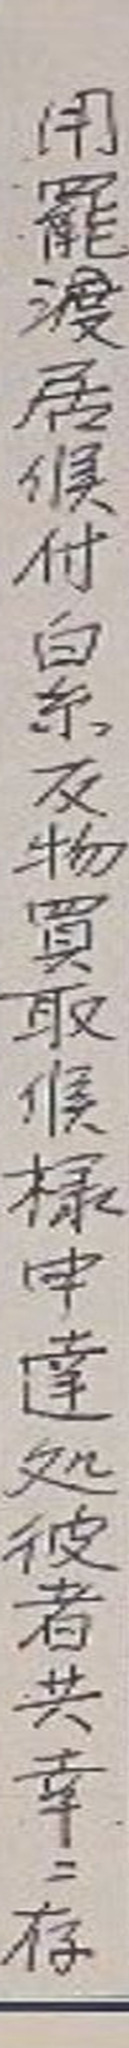用罷渡居候付白糸反物買取候様申達処彼者共幸に存
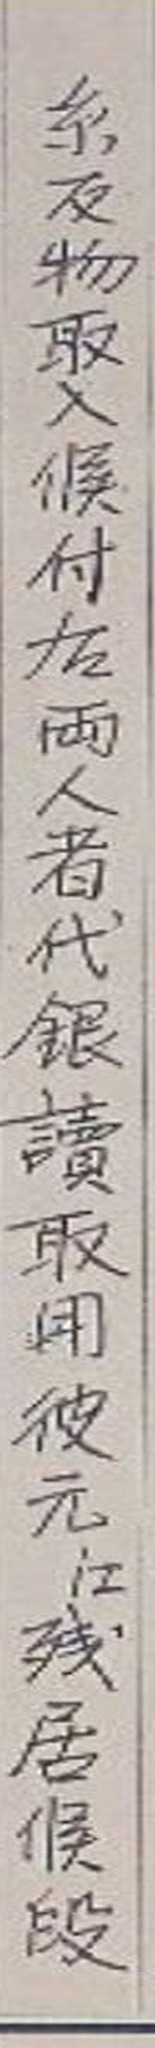糸反物取入候付右両人者代銀読取用彼元え残居候段
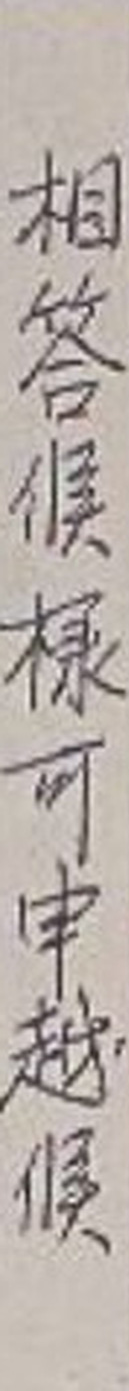相答候様可申越候
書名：支那冊封使来琉諸記 下巻
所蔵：University of the Ryukyus Library
